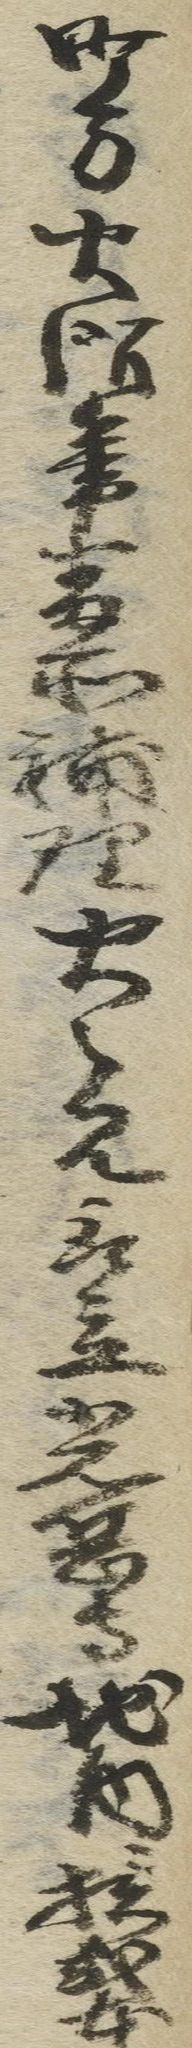町方火消事番所ほり火之見取立光岳寺地内二拾弐本
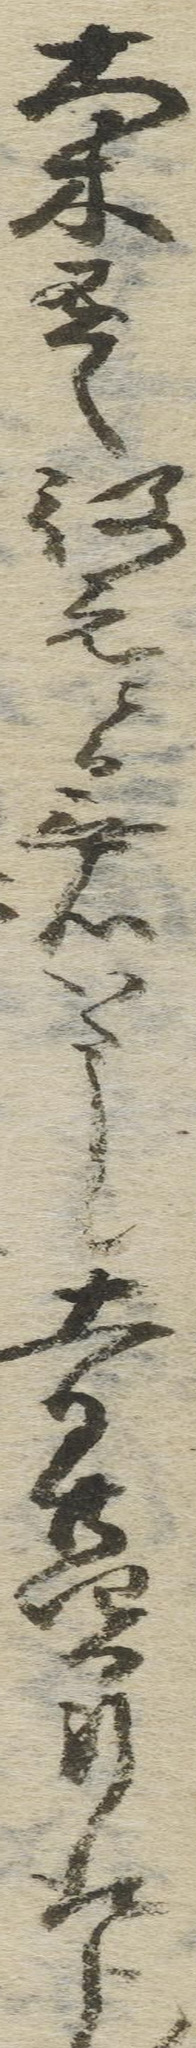大木有之役元二而無心いたし十一月廿四日引取申候
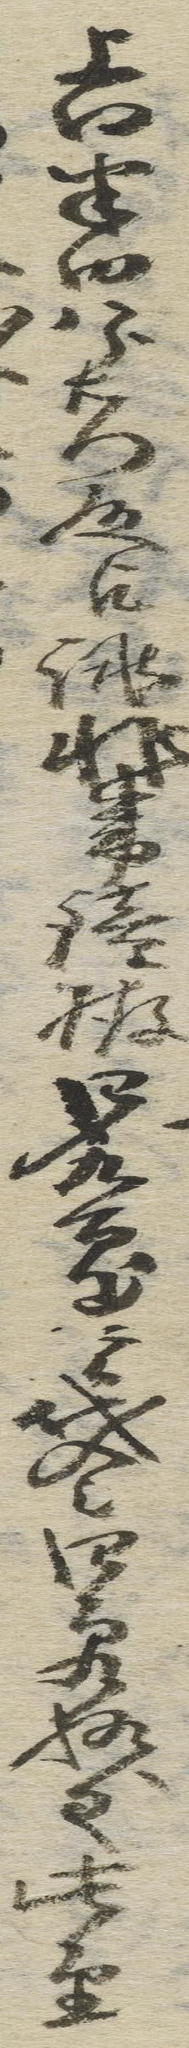上田半四郎右衛門殿江誹状事鐘拵四〆九百金二而代金四百九拾匁此金
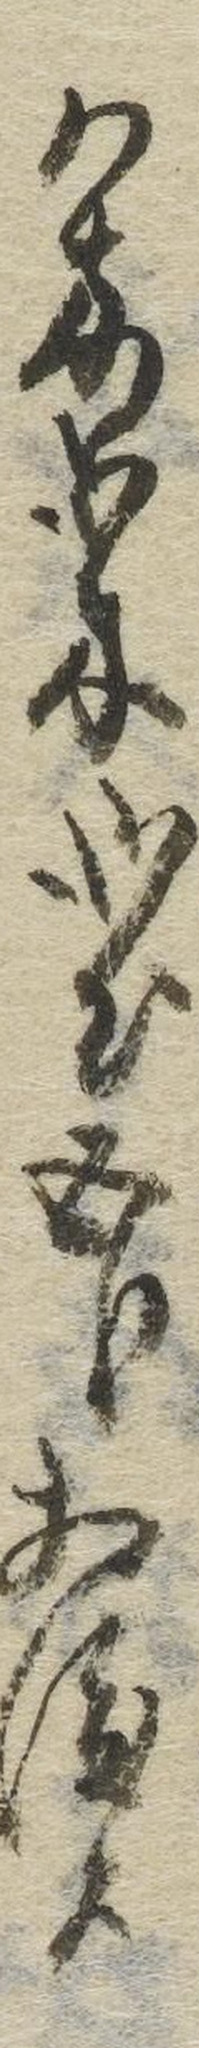八両弐分弐朱五厘相渡ス
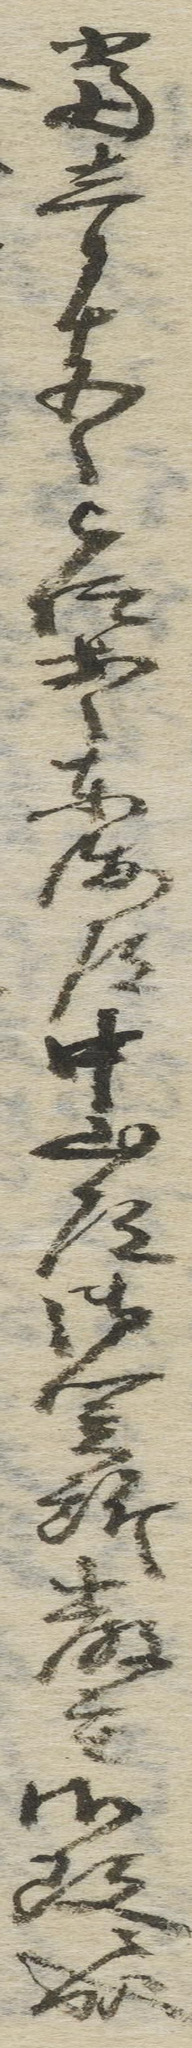当十二月十五日被仰出候東海道中山道御関所厳重御改被成
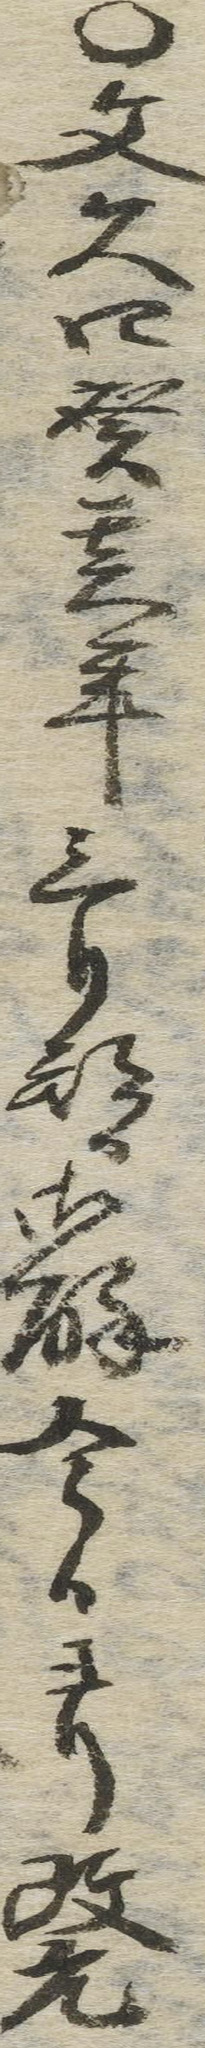○文久四癸亥年三月朔日御触今日ヨリ改元
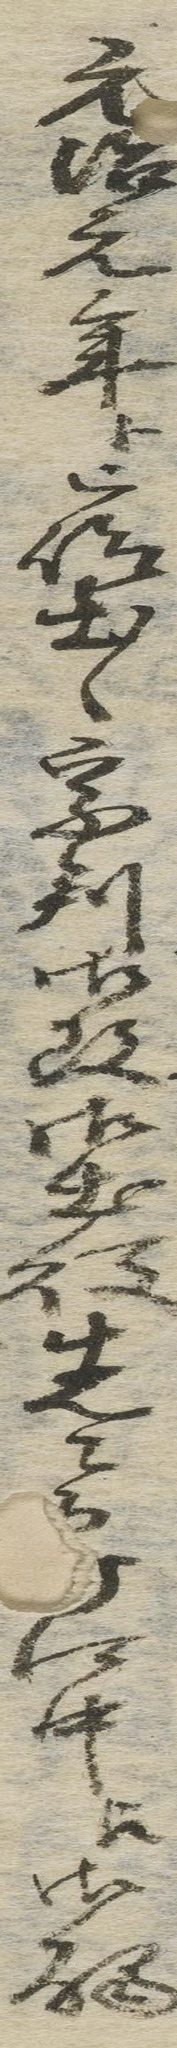元治元年ト被仰出候宗判御改御出役先々二而郷中江御触
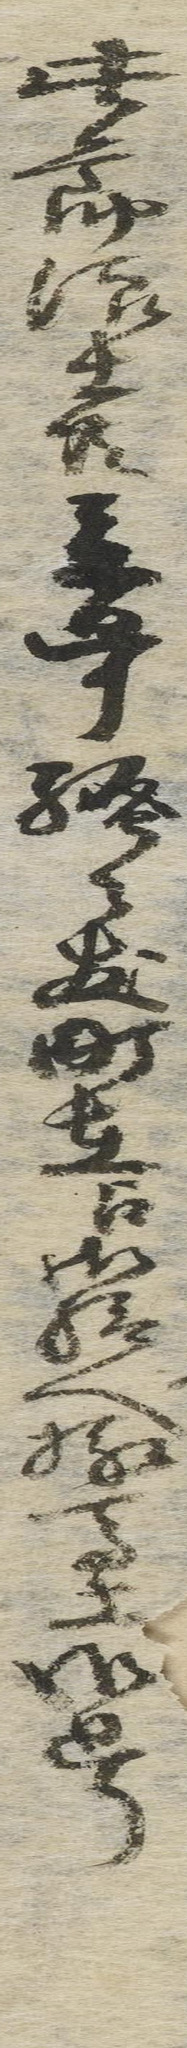此節浪士共立廻り騒敷町在江御役人様馬士御廻り
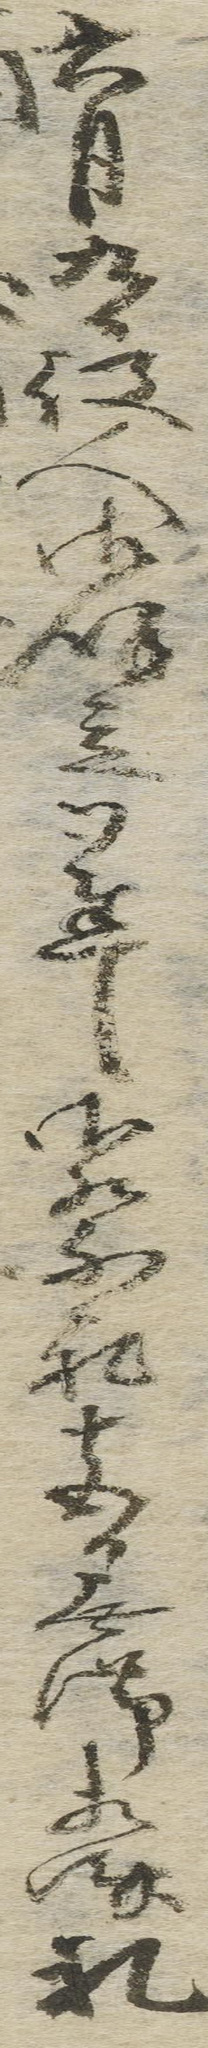六月九日役人御呼立御達し御祭礼十五日無帯相済礼
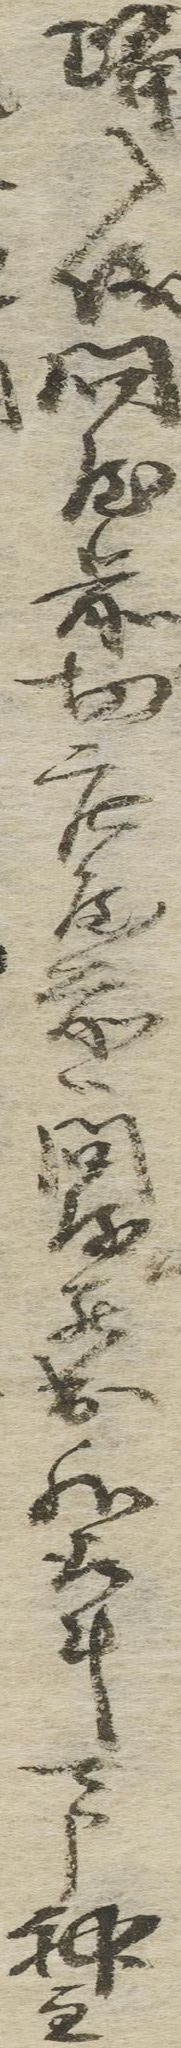踊之儀問屋前切庄屋前ハ問屋江罷出候様取計可申神主
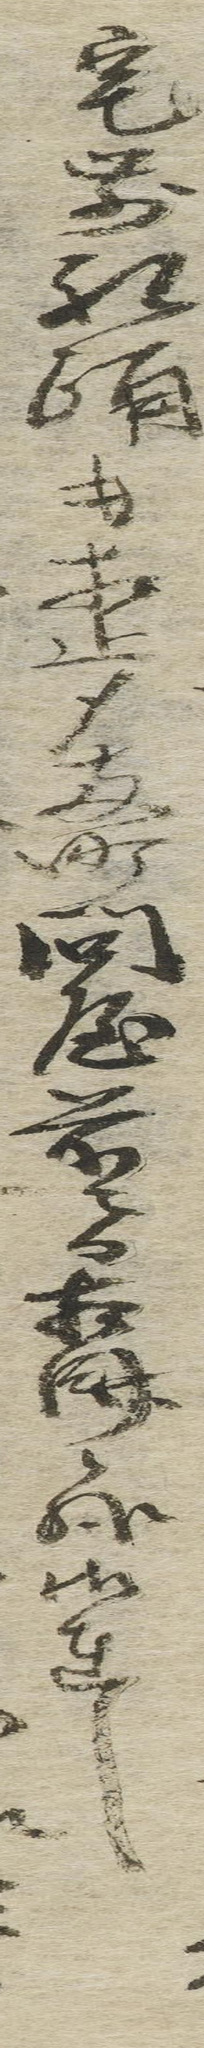宅前礼踊も相止メ両町問屋前二而相済候様御達し
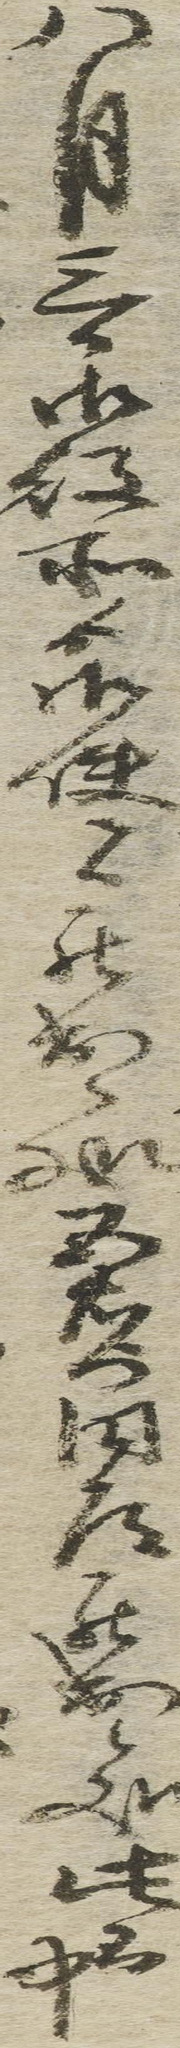八月三日御役所ゟ御使二而罷出候様五右衛門同道罷出候処此間中
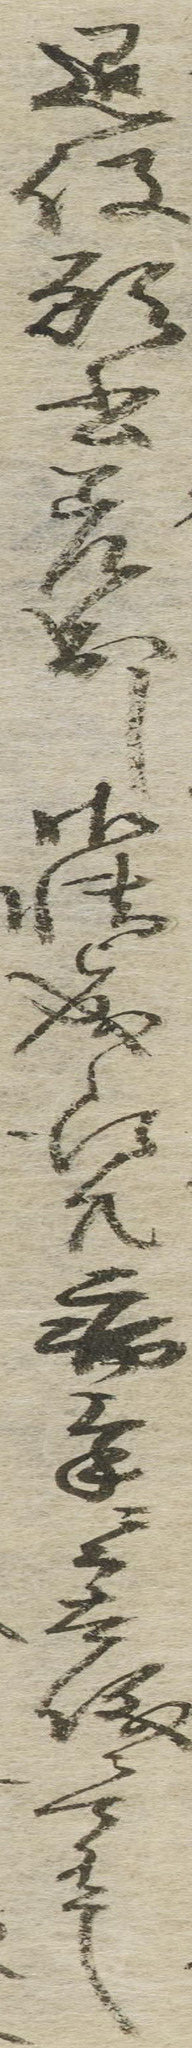退役願書差出し御情被成候得共病身二而太儀二有之
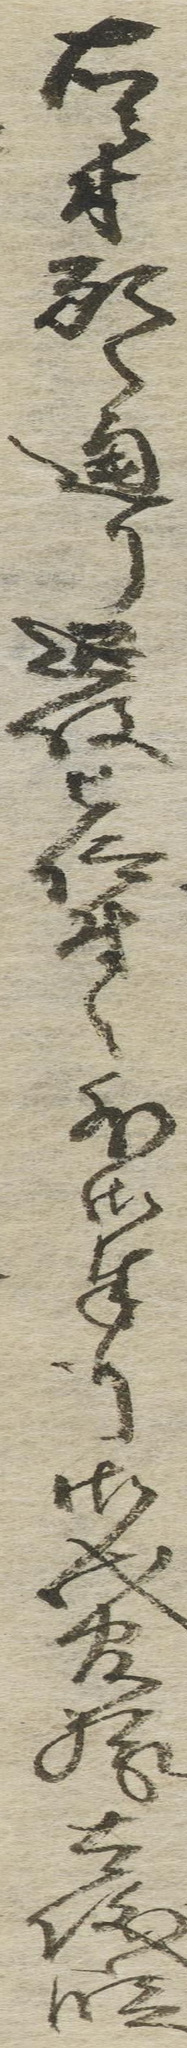右二付願之通り退役被仰付候外御奉行御代官様太儀候段
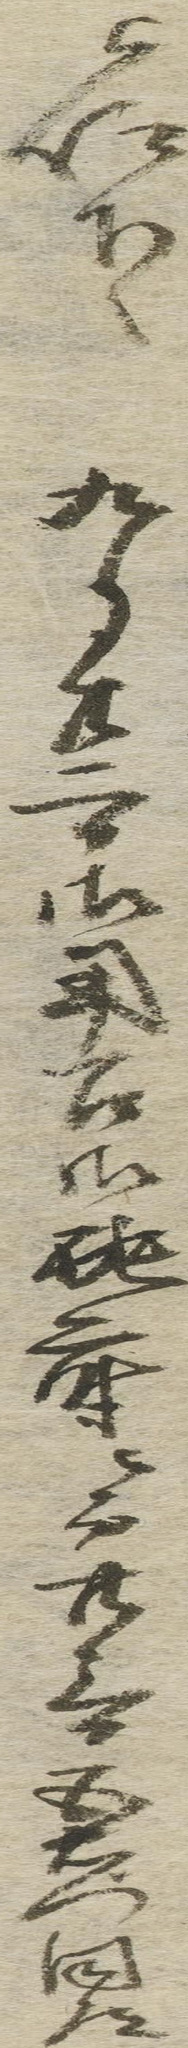被仰下候九月廿二日御用召御前二而廿三日五右衛門同道

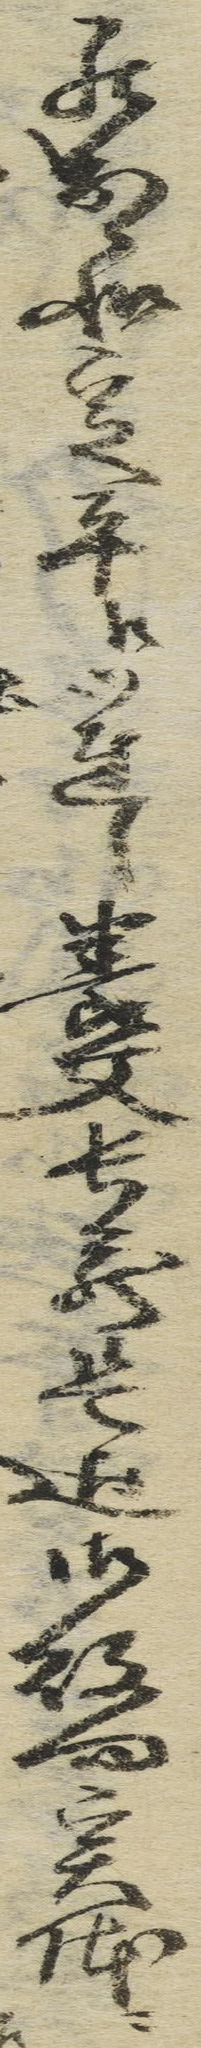罷出候様定平江御達し貴長蔵是迄御役向実体二
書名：信濃越後　地震書留
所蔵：東京大学地震研究所図書室 Earthquake Research Institute Library, The University of Tokyo, JAPAN
